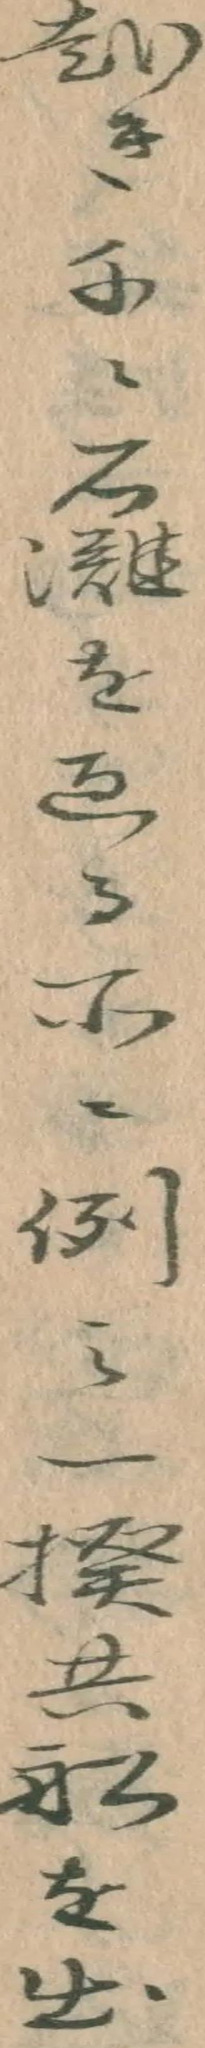赴き千々石灘を過る所に例之一揆共舩を出
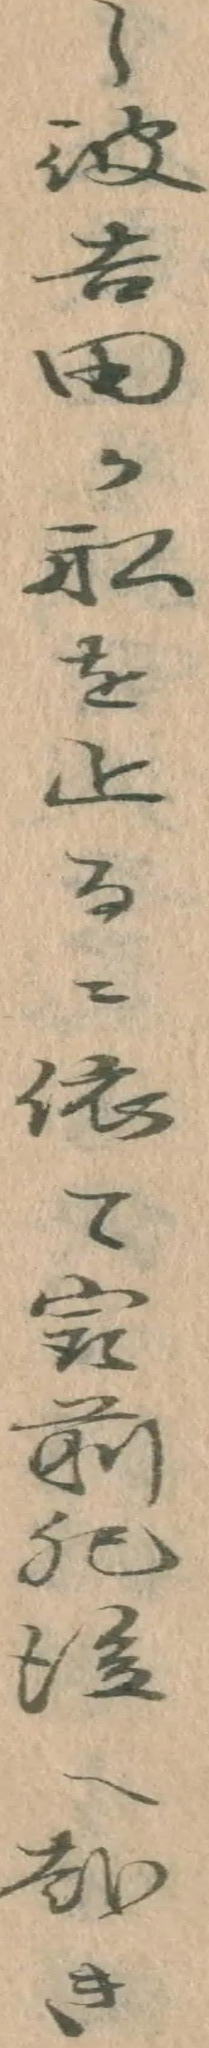し彼吉田か舩を止るに依て最前肥後へ赴き
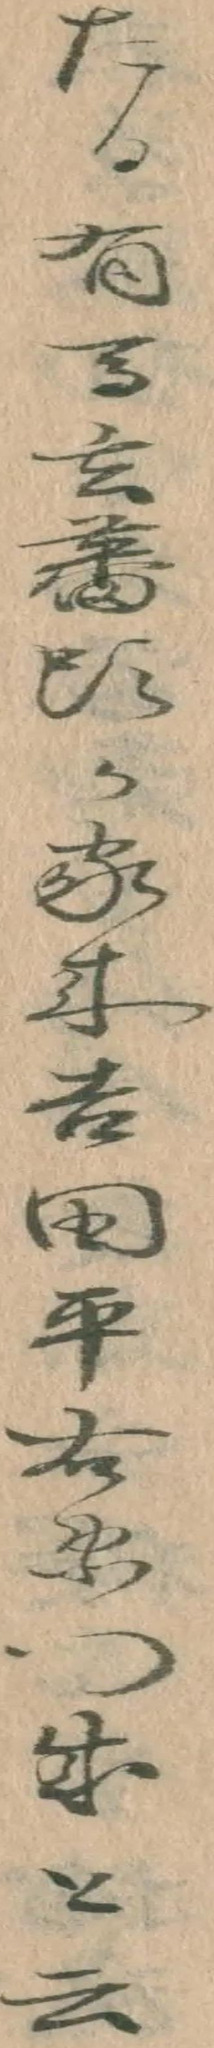たる有馬玄蕃頭か家来吉田平右衛門成と云
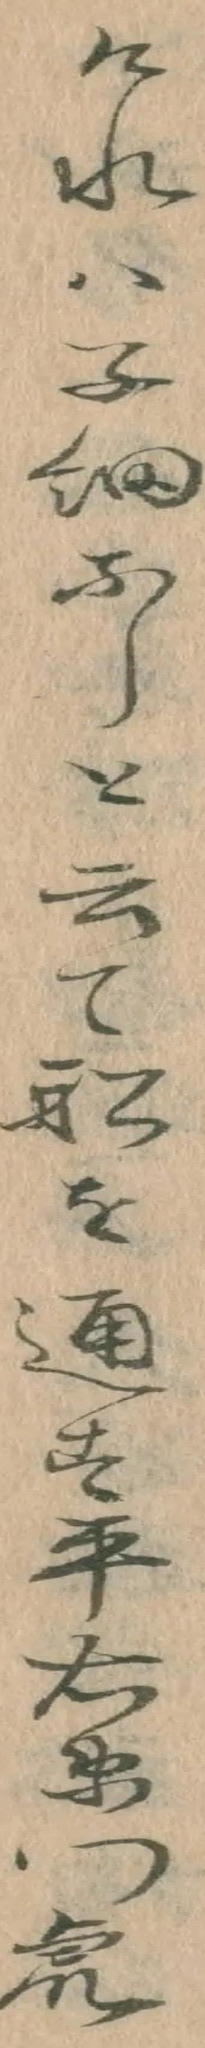けれは子細なしと云て舩を通春平右衛門虎
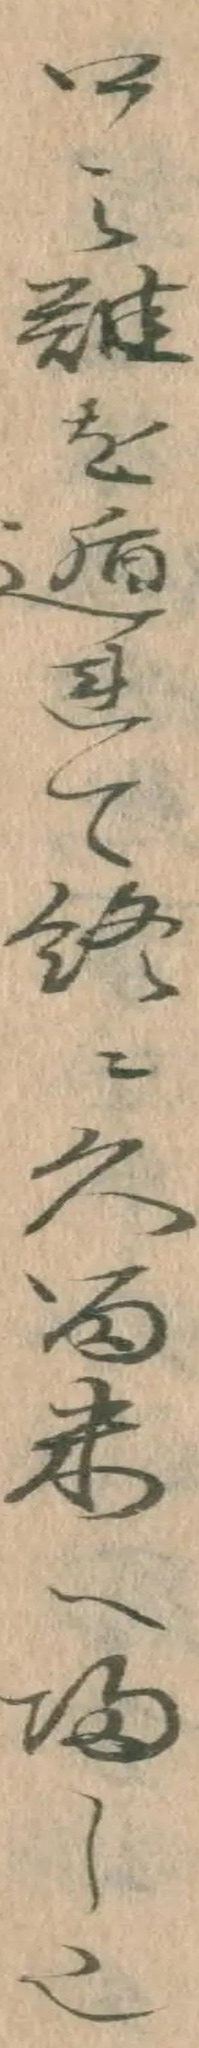口之難を遁連て終に久留米へ帰し也
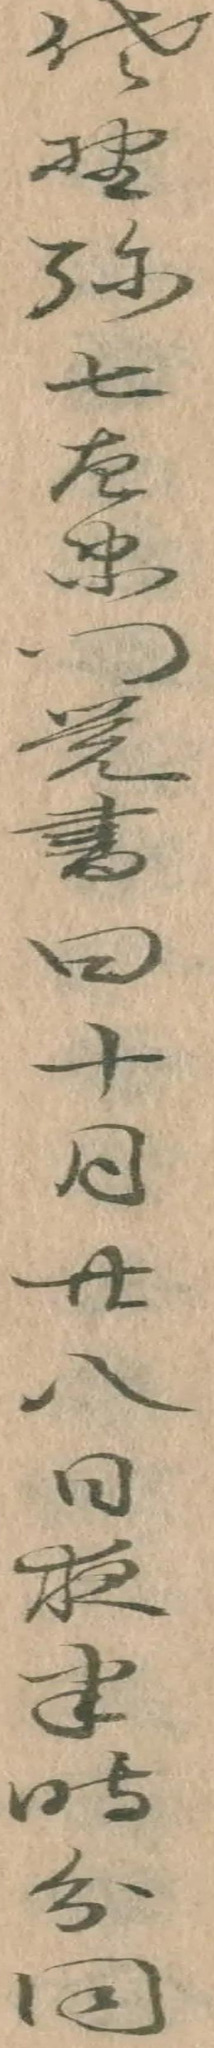佐野弥七左衛門覚書曰十月廿八日夜半時分同
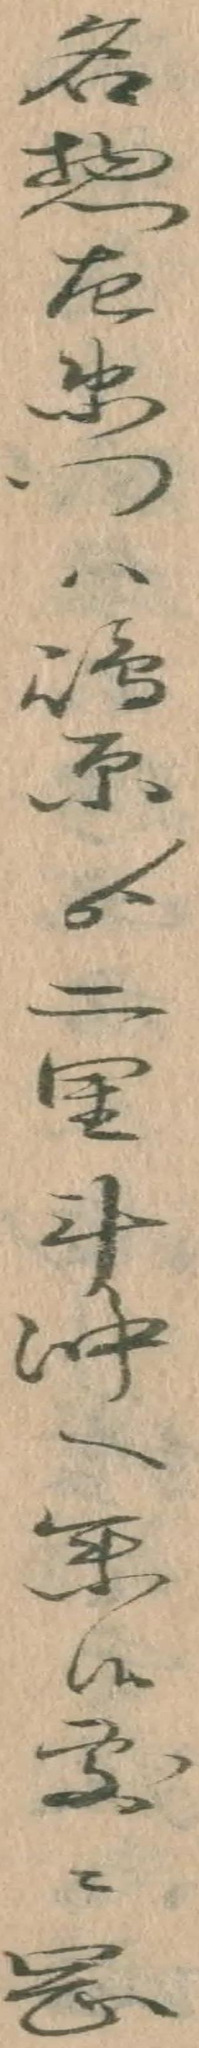名惣左衛門は島原ゟ二里斗沖へ参候処に岡
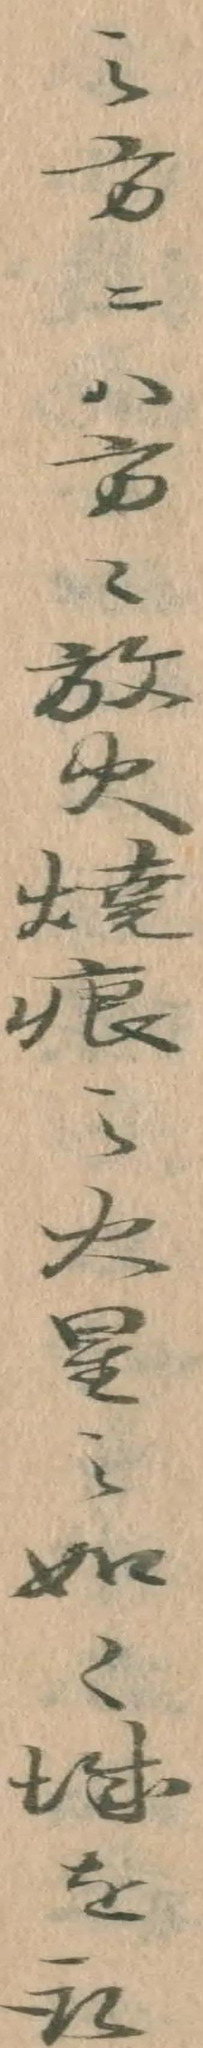之方には方々放火焼痕之火星之如く城を取
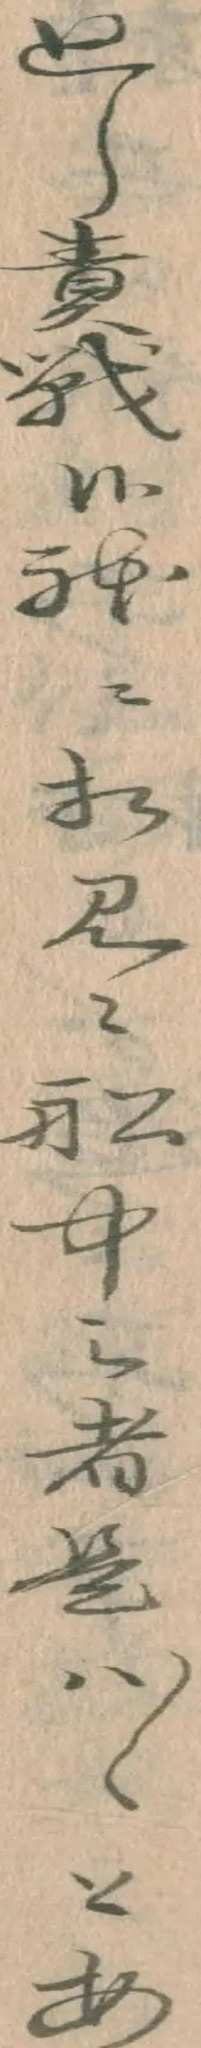廻し責戦候躰に相見に舩中之者是は〱とあ
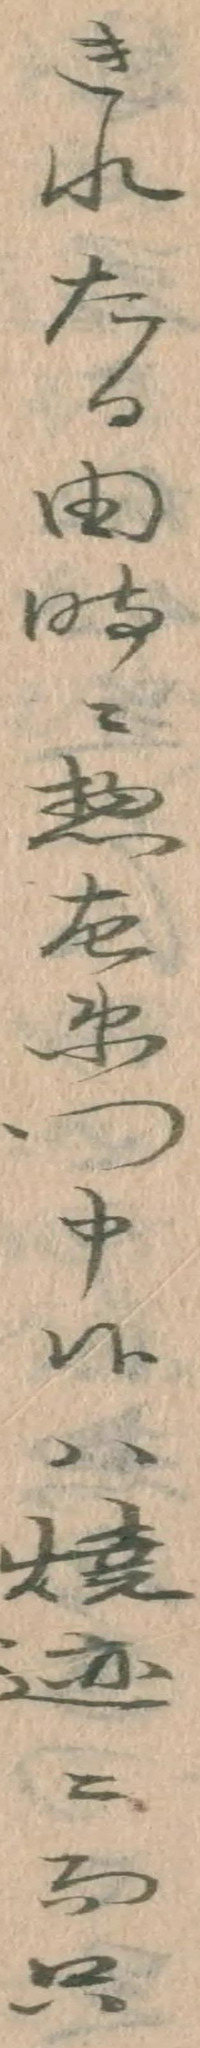きれたる由時に惣左衛門申候は焼迹に而只
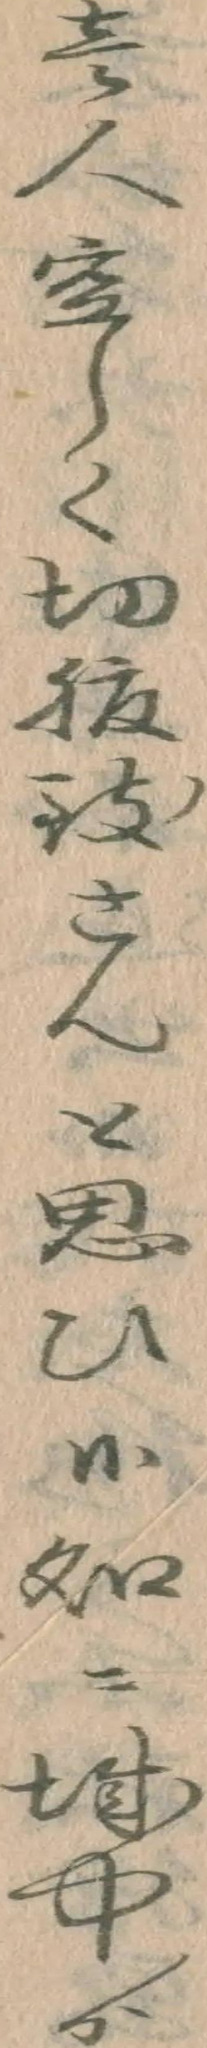壱人空しく切抜致さんと思ひ候処に城中ゟ
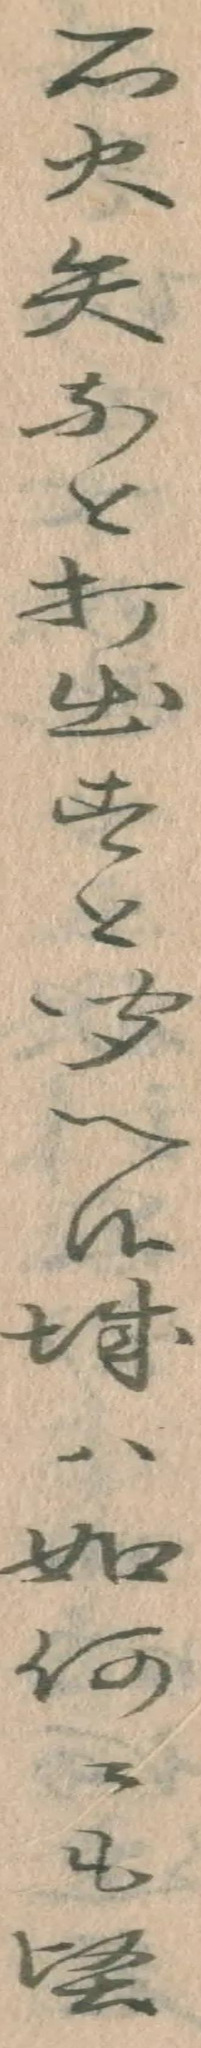石火矢なと打出春と聞へ候城は如何にも堅
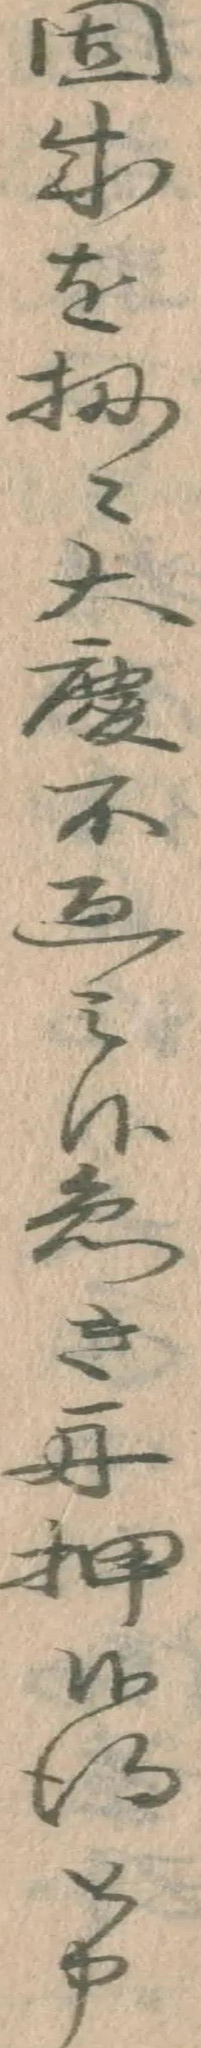固成を扨々大慶不過之候急き舟押候得と申
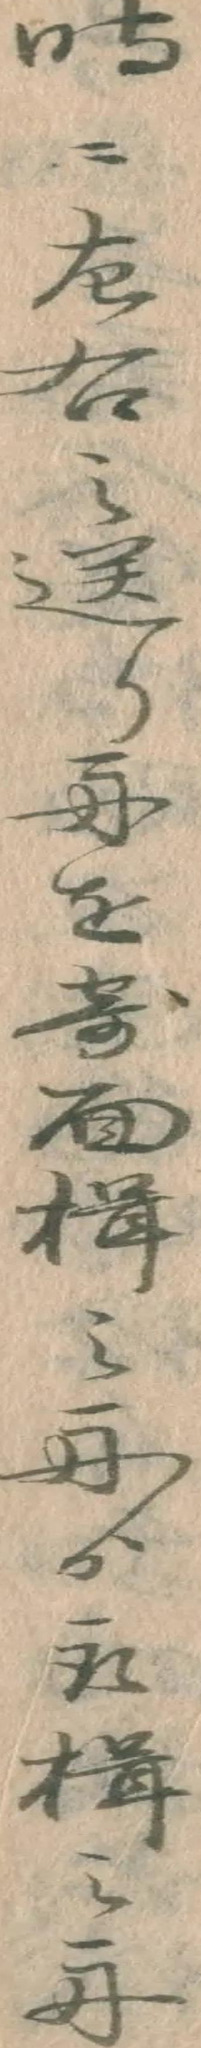時に左右之送り舟を寄面楫之舟ゟ取楫之舟
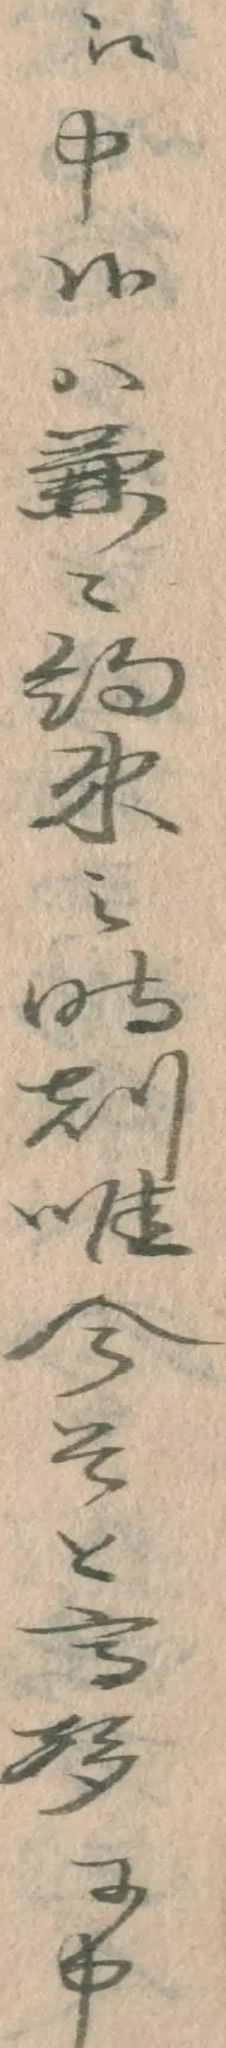江申候は兼々約束之時刻唯今そと高声尓申
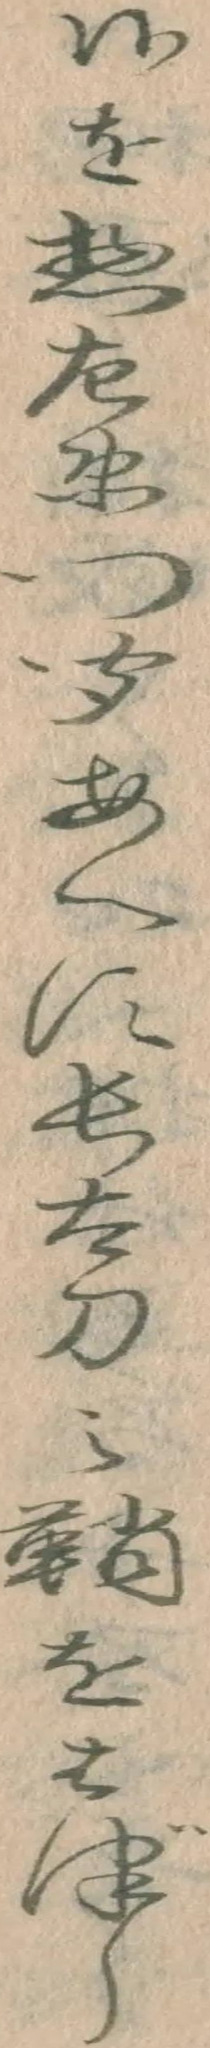候を惣左衛門聞あへ須長太刀之鞘を者津し
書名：切支丹御退治記 49巻. [2]
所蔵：国立国会図書館 National Diet Library, JAPAN
